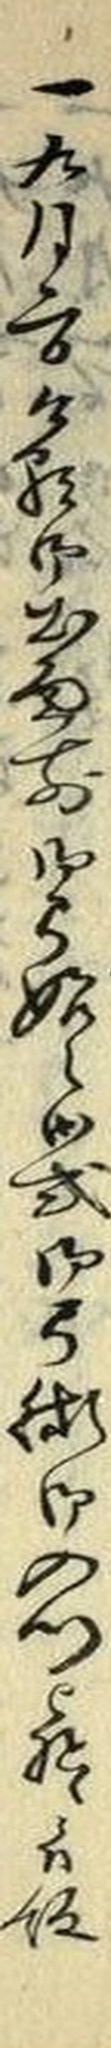一九月二日今朝御出殿前御弓始之御式御弓術御入門被遊候ニ付飯
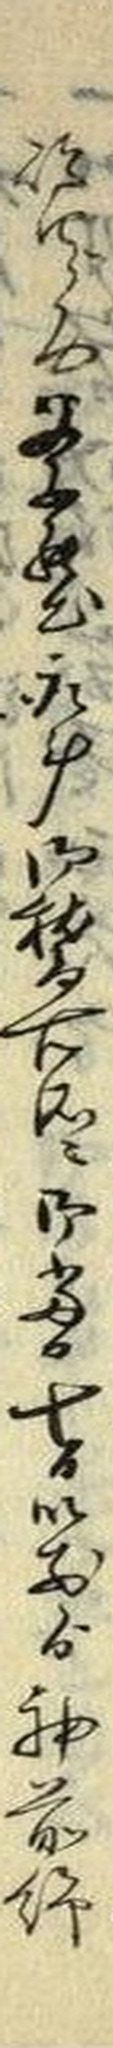嶋四郎右衛門父子罷出取計御稽古所ニ御当日七日以前ゟ神前飾
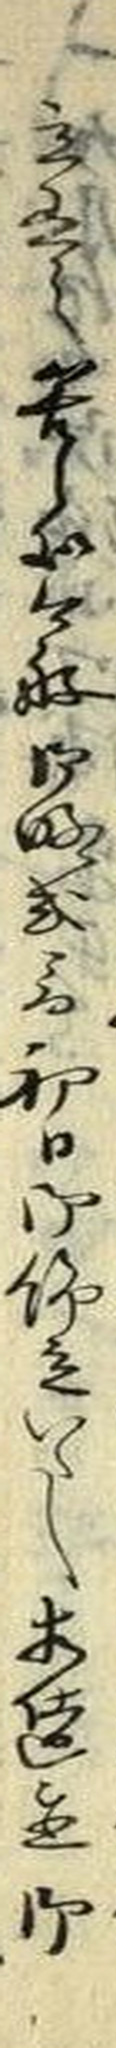立有之筈之処今般御略式ニ而初日御飾立いたし相仕廻置御
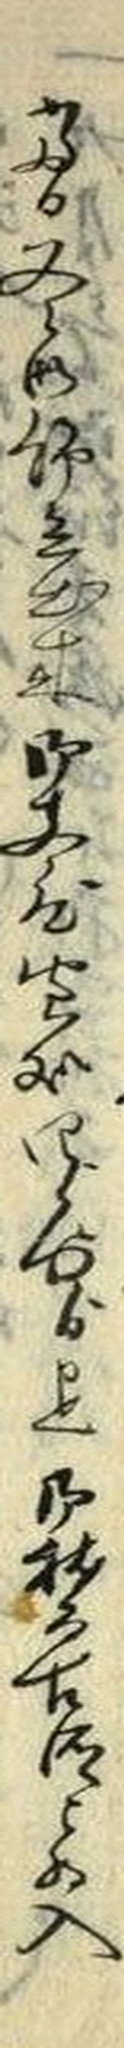当日又々御飾立出来御支度宜処四郎右衛門申上御稽古所へ被為入
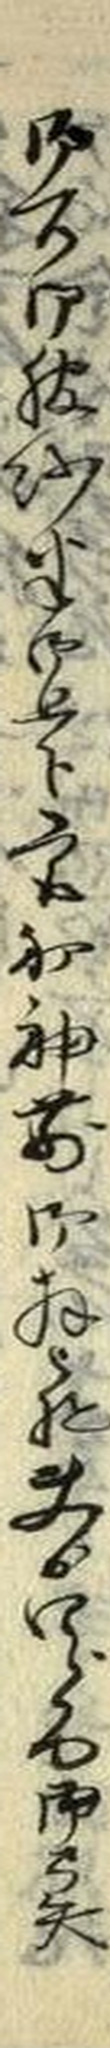御召御服紗半御上下最初神前御拝被遊夫ゟ四郎右衛門御弓矢
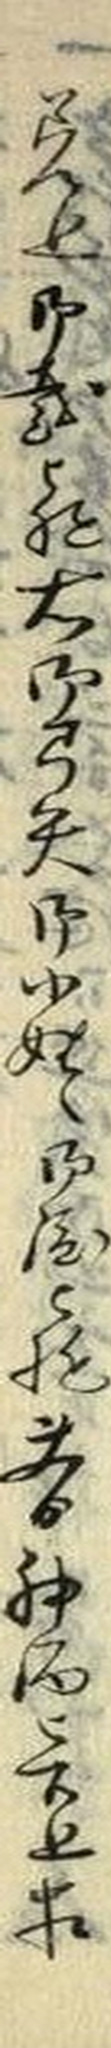差上御戴被遊右御弓矢御小姓へ御渡被遊夫ゟ神酒被召上相
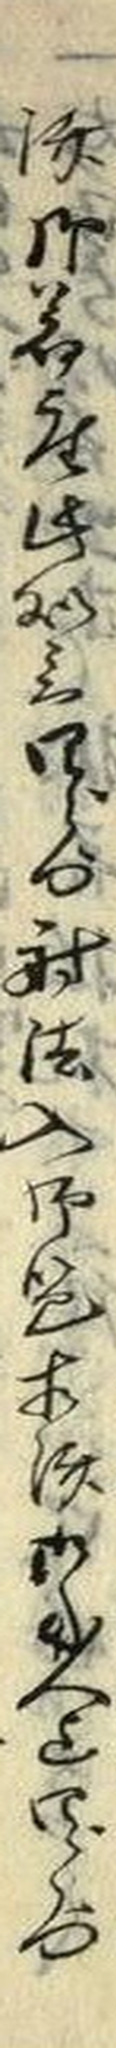済御着座此処ニ而四郎右衛門対法入御覧相済御用人迄四郎右衛門
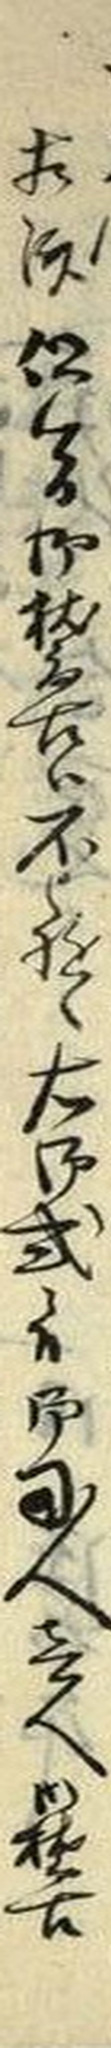相済但今日御稽古ハ不被遊候右御式ニ付御用人壱人御稽古
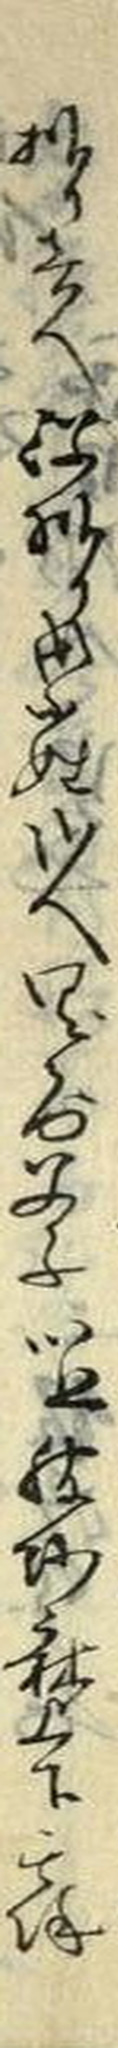掛り壱人役掛り御小姓弐人四郎右衛門父子以上服紗麻上下其余
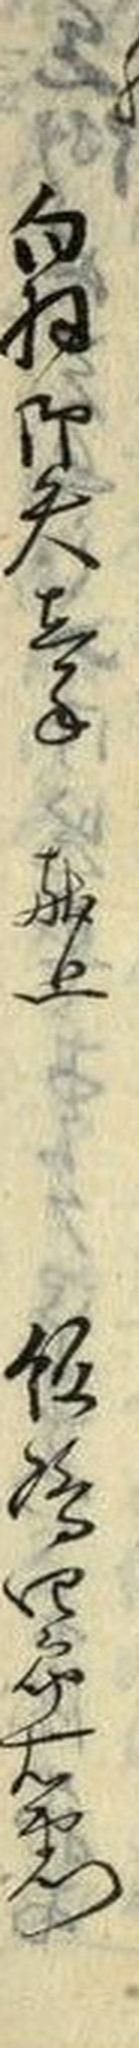白羽御矢壱手献上飯嶋四郎右衛門

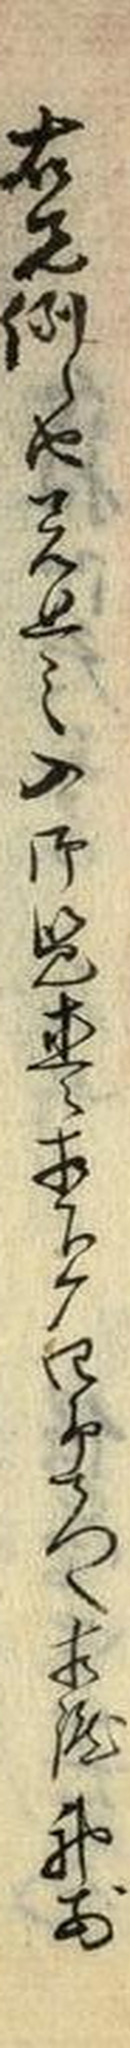右先例之由差上之入御覧直ニ相下ケ四郎右衛門へ相渡神前
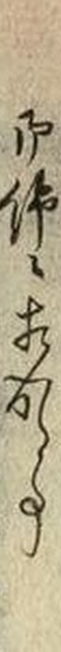御飾ニ相成候事
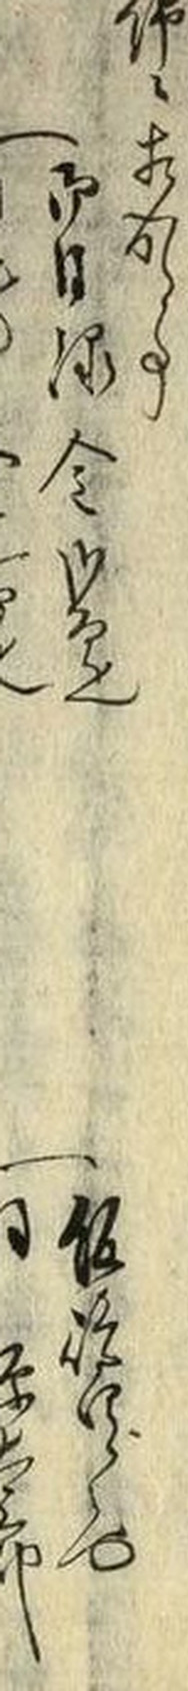御目録金弐百疋飯嶋四郎右衛門
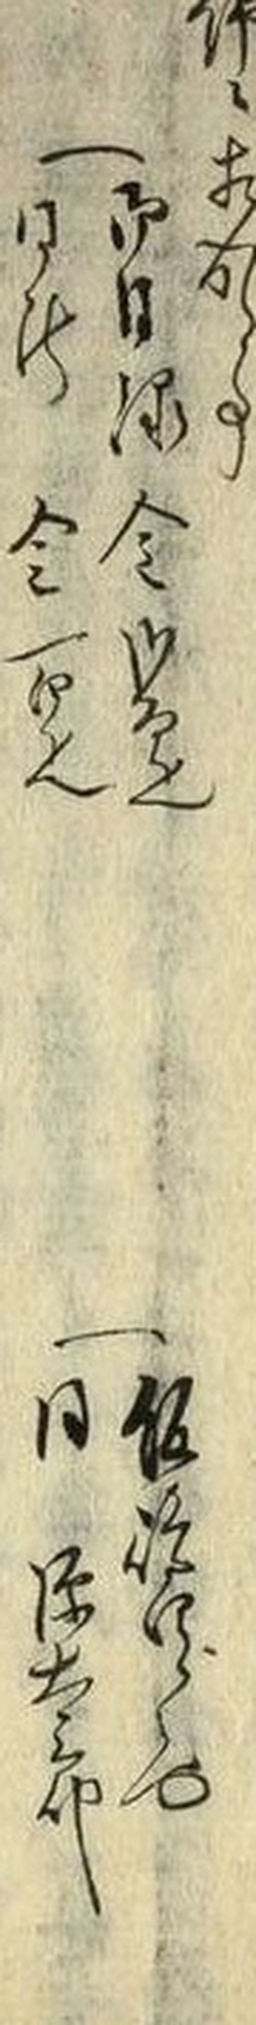同断金百疋同源太郎
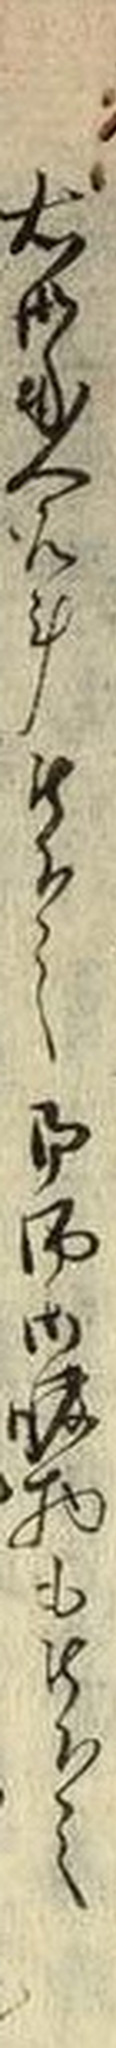右御用人取計被下之御酒御吸物も被下之
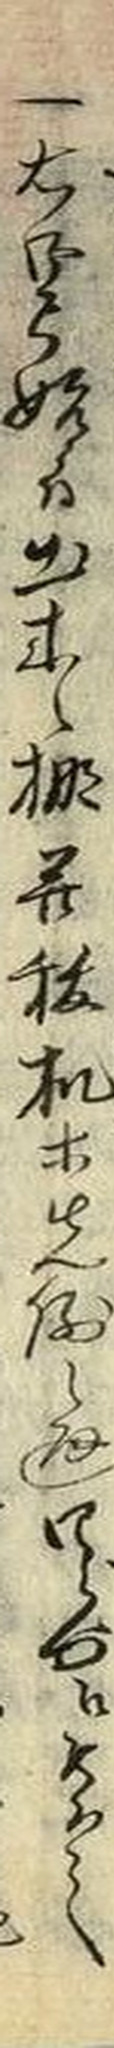一右御弓始ニ付出来之棚幷祓机等先例之通四郎右衛門江被下之
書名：少傅日録抄（斉承付側向頭取日記、在国）
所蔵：福井県文書館 Fukui Prefectural Archives
